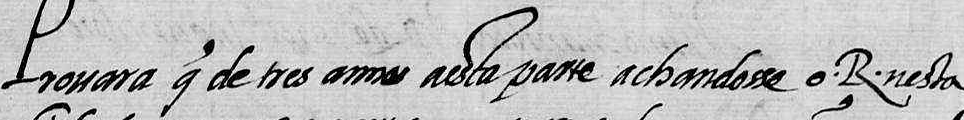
Prouara q̄ de tres annos a esta parte achandosse o .R. nesta
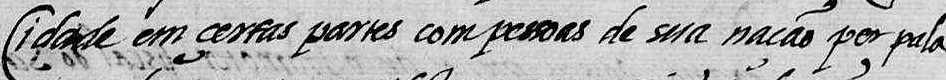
Cidade em certas partes com pessoas de sua nação por pala
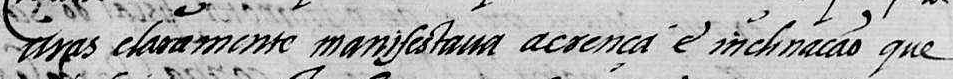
uras claramente manifestaua a crença e inclinaçaõ que
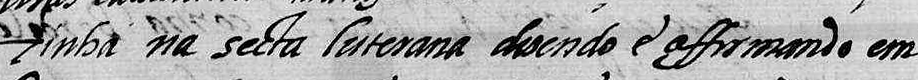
tinha na secta luterana disendo e affirmando em
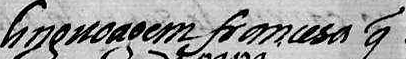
linguoagem francesa q̄ _
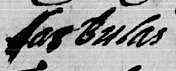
as Bulas
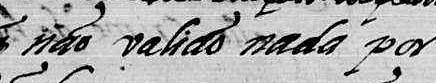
não valiaõ nada por
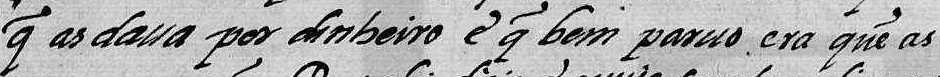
q̄ as daua por dinheiro e q̄ bem paruo era quē as
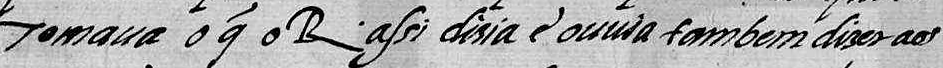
Tomaua o q̄ o R. assi disia e ouuia tambem dizer aos
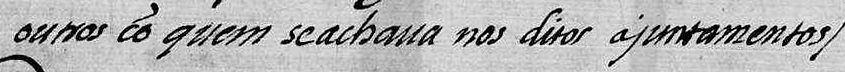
outros cō quem se achaua nos ditos ajuntamentos /.
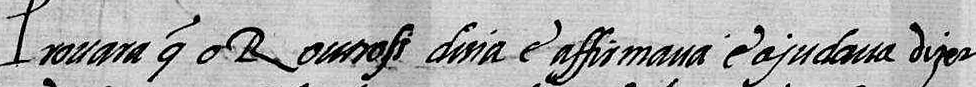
Prouara q̅ o R outrosi disia e affirmaua e ajudaua dizer
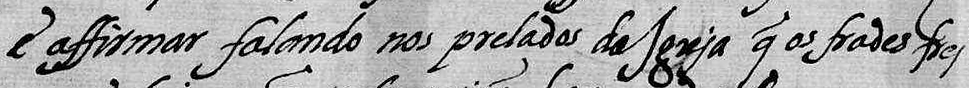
e affirmar falando nos prelados da Jgreja q̅ os frades frej
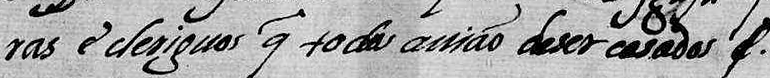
ras e cleriguos q̄ todos auião de ser casados
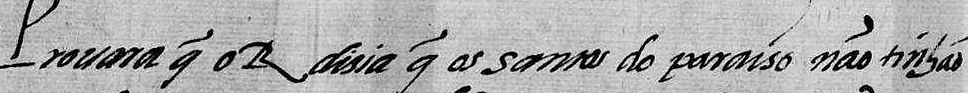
Prouara q̅ o R dizia q̄ os santos do paraiso não tinhão
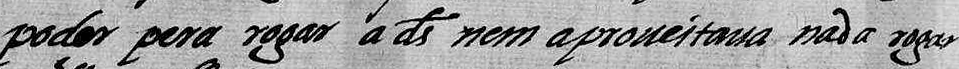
poder pera rogar a d̄s nem aproueitaua nada rogar
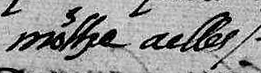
moslhe a elles /.
